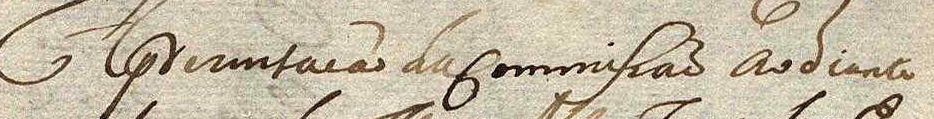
Aprezentacaõ da Commissaõ ao diante
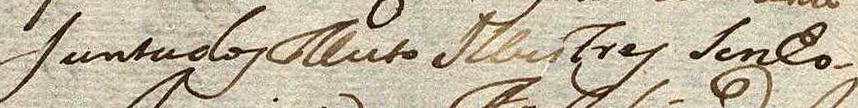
Junta dos Muto Illustres Senho
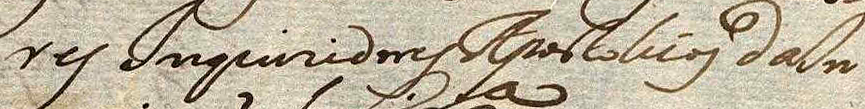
res Inquizidores Apostolicos da In
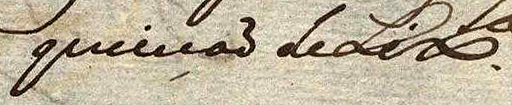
quisiçaõ de Lix.a
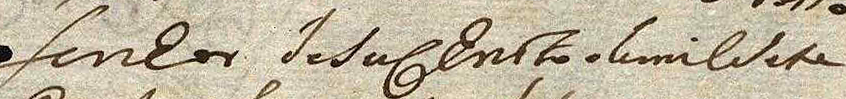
senhor IeSu Christo de mil Sete
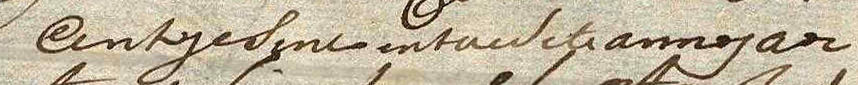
Centos e Sincoenta e sete annos aos
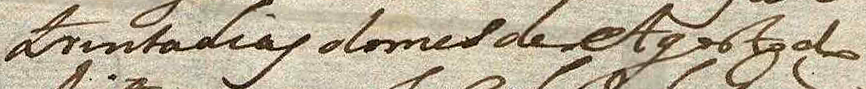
trinta dias do mes de Agosto do
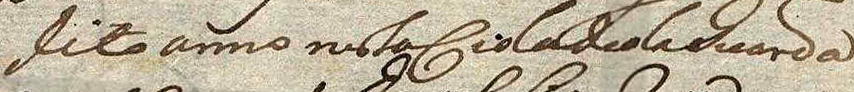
dito anno nesta Cidade da Guarda
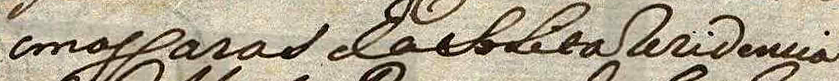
em as Cazas da SoLita Rezidencia
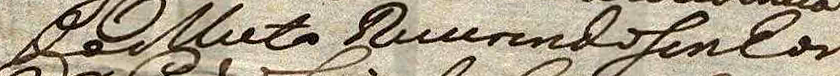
do Muto Reuerendo senhor
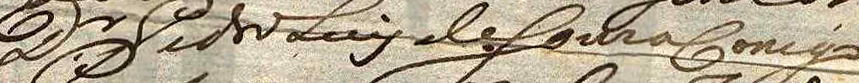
D.r Pedro Luis de souza Conigo
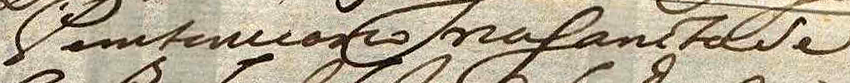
Penitenciario na sancta se
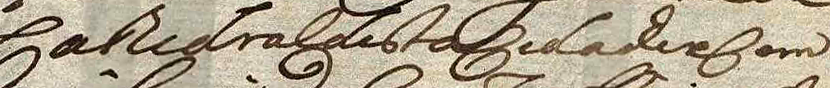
Cathedral desta Cidade e Com
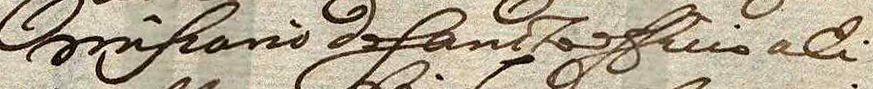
missario do sancto officio ahi
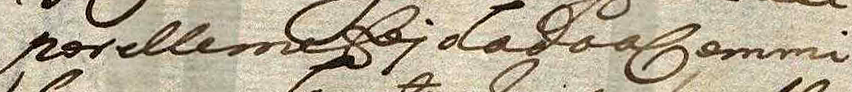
por elle me foj dada a Commi
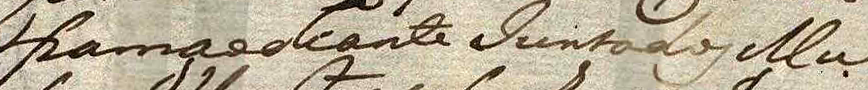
ssam ao diante Iunta dos Mu
